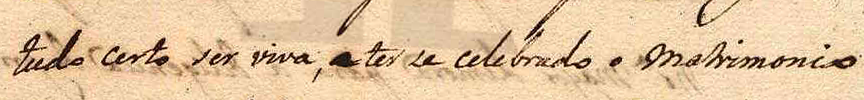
tudo certo ser viva, e ter se celebrado o matrimonio
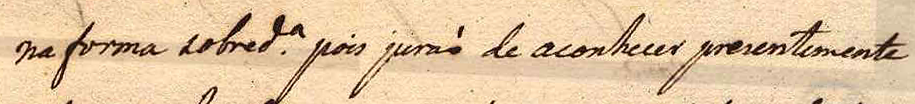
na forma sobred.a pois juraõ de a conhecer prezentemente
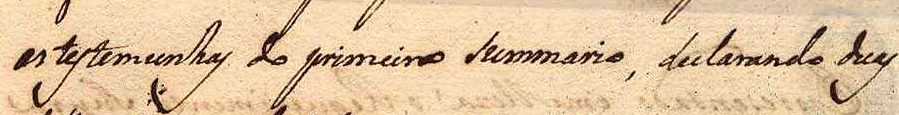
as testemunhas do primeiro summario, declarando duas
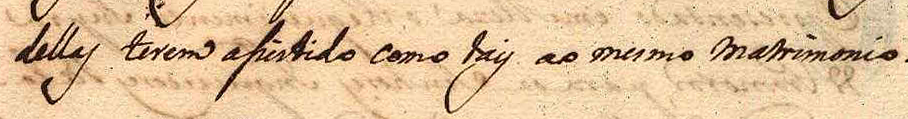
dellas terem assistido como tais ao mesmo matrimonio.
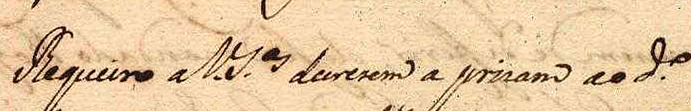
Requeiro a V. S.as decretem a prizam ao d.o
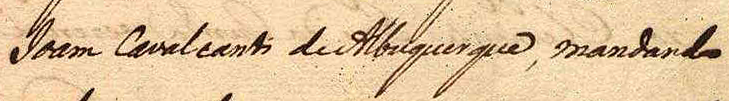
Ioam Cavalcanti de Albuquerque, mandando
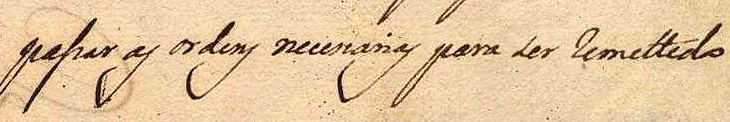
passar as ordens necessarias para ser Remettido
